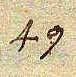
49
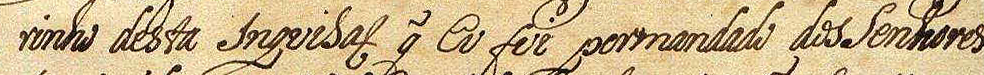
rinho desta Inquisaꝭ, q̄ Ev fiz por mandado dos Senhores
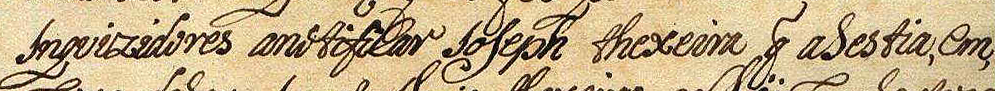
Inquizidores a notificar Ioseph thexeira, q̄ aSestia, em,
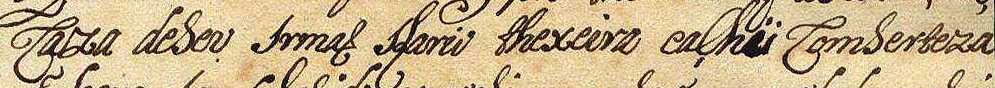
Caza de Sev Irmaõ Ilario thexeira e aChei Com serteza
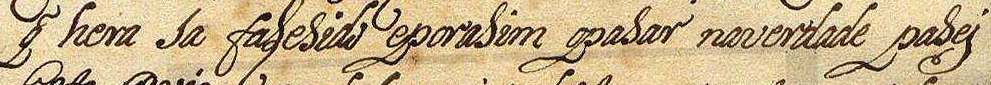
q̄ hera ja falesido e por asim pasar na verdade pasej
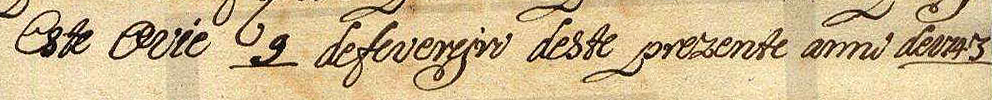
Este Ovie 9 de feverejro deste prezente anno de 1743
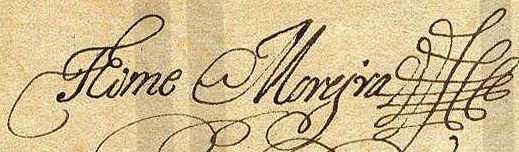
Thome Morejra
